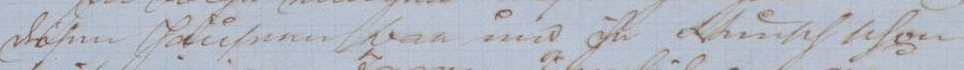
diesen Häusern war uns ihr Wunsch schon
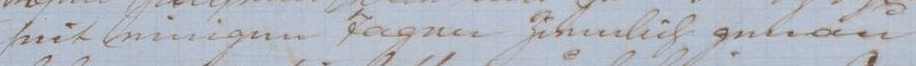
seit einigen Tagen ziemlich genau
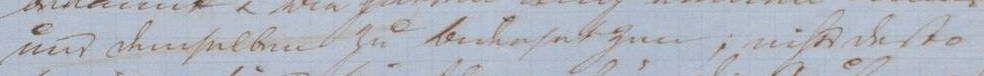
uns demselben zu widersetzen; nichtsdesto
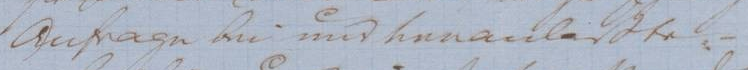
Anfrage bei uns veranlaßte. –
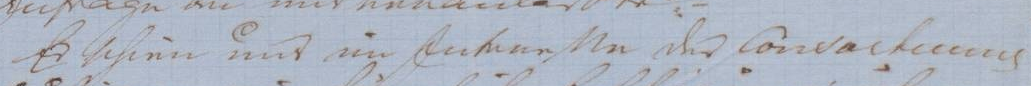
Es schien uns im Interesse des Consortium's
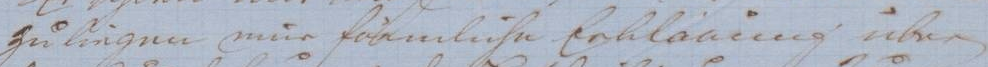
zu liegen eine förmliche Erklärung über
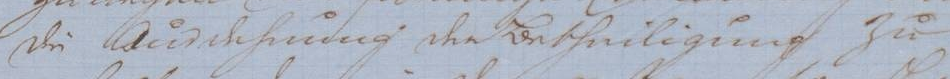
die Ausdehnung der Betheiligung zu
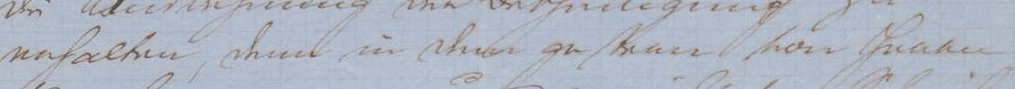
erhalten, denn in dem gestern von Herrn
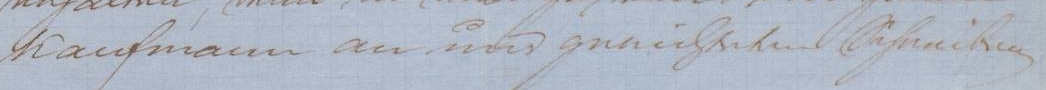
Kaufmann an uns gerichtete Schreiben
